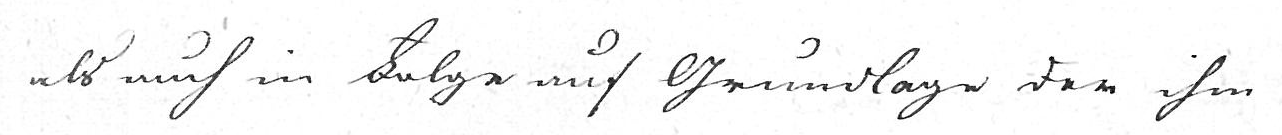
als auch in Folge auf Grundlage der ihm
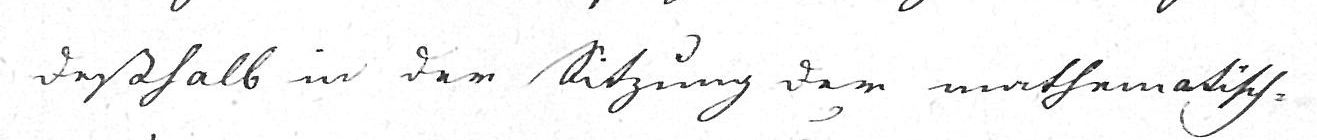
deßhalb in der Sitzung der mathematisch-
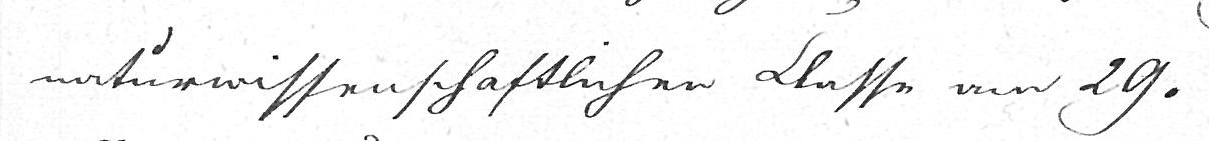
naturwissenschaftlichen Classe am 29.
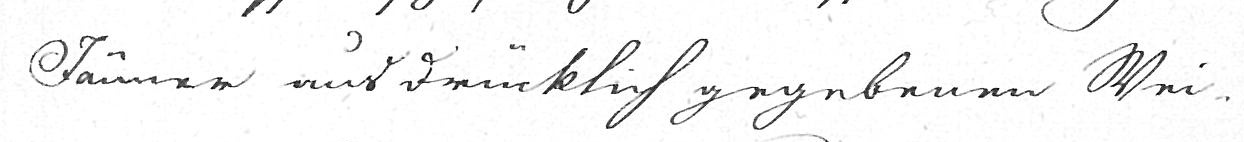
Jänner ausdrücklich gegebenen Wei-
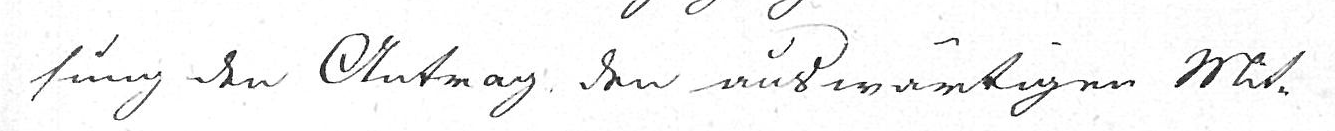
sung den Antrag den auswärtigen Mit-
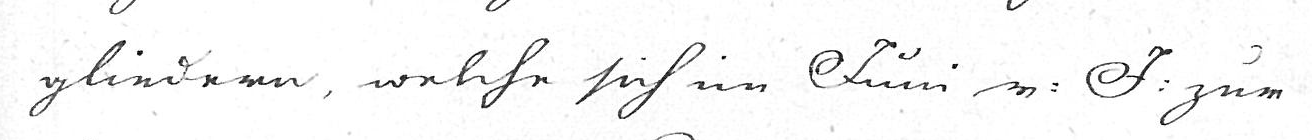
gliedern, welche sich im Juni v. J. zur
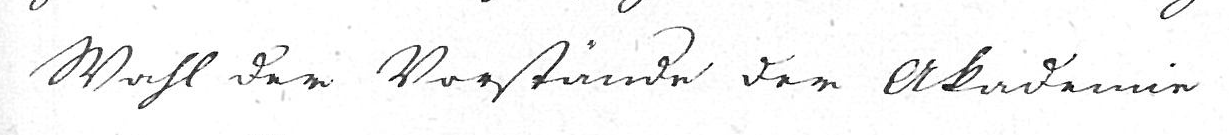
Wahl der Vorstände der Akademie
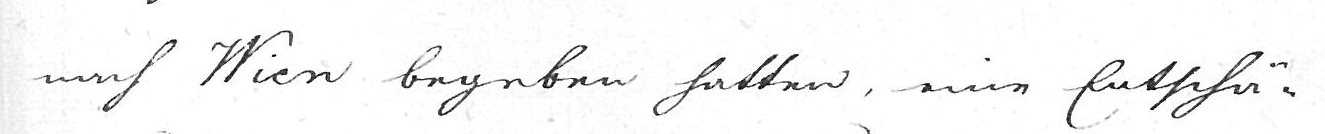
nach Wien begeben hatten, eine Entschä-
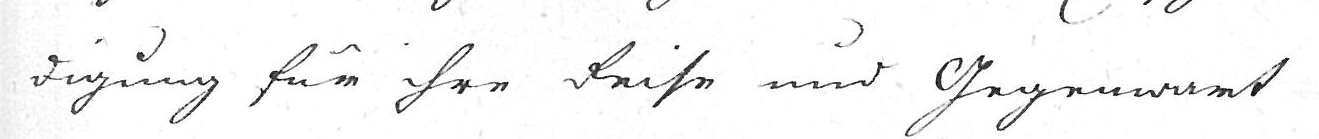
digung für ihre Reise und Gegenwart
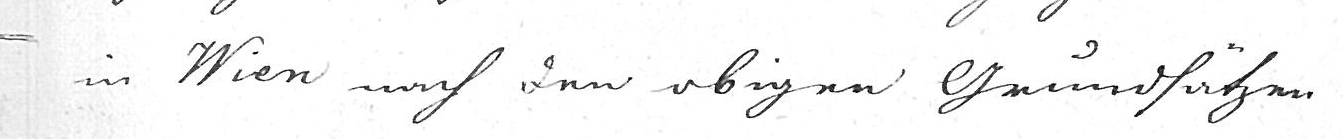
in Wien nach den obigen Grundsätzen
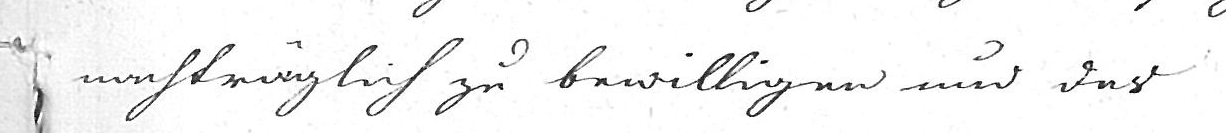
nachträglich zu bewilligen und das
